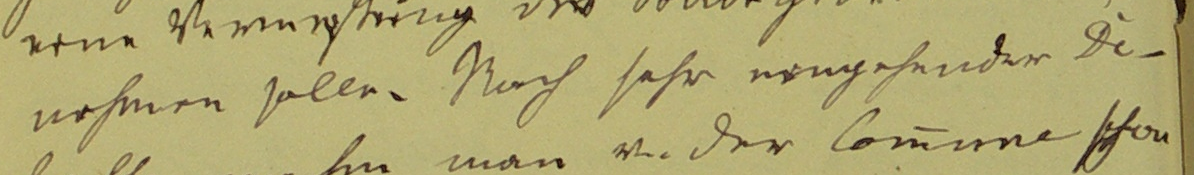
nehmen solle. Nach sehr anregender De¬
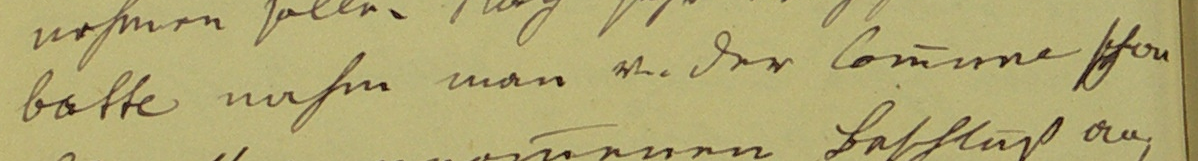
batte nahm man wie von der Commune schon
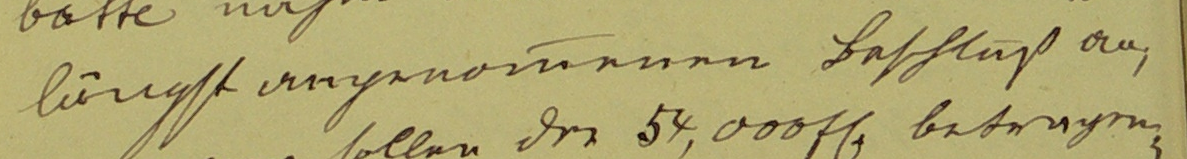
längst angenommen Beschluß an
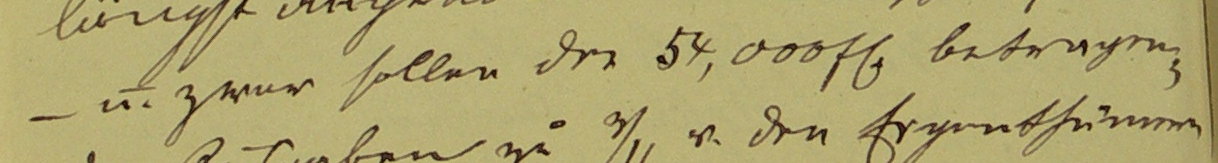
– und zwar sollen die 54,000 Fl betragen,
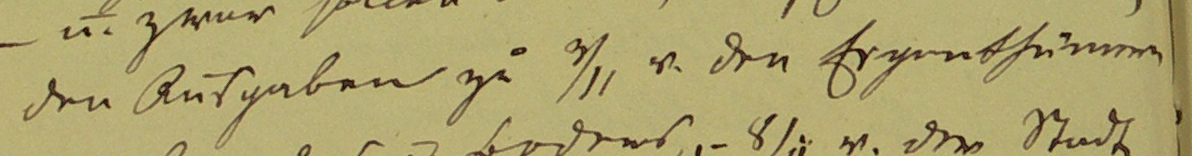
die Ausgaben zu 3/11 von den Eigenthümern
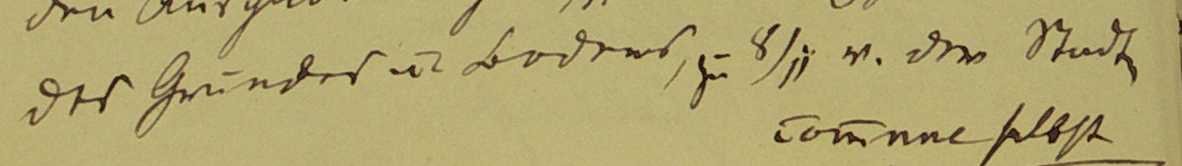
des Grundes und Bodens , zu 8/11 von der Stadt¬
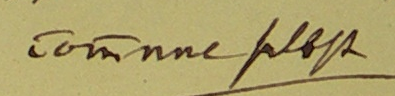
commune selbst
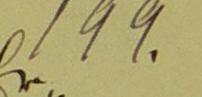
199
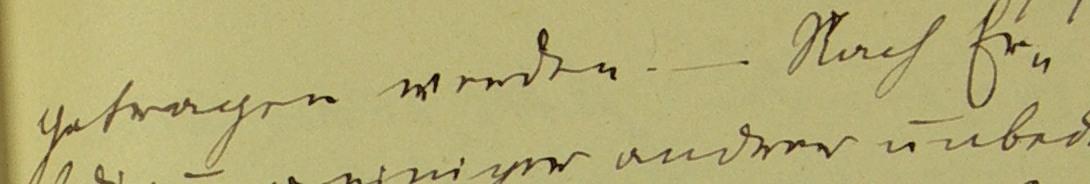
getragen werden.- Nach Er¬
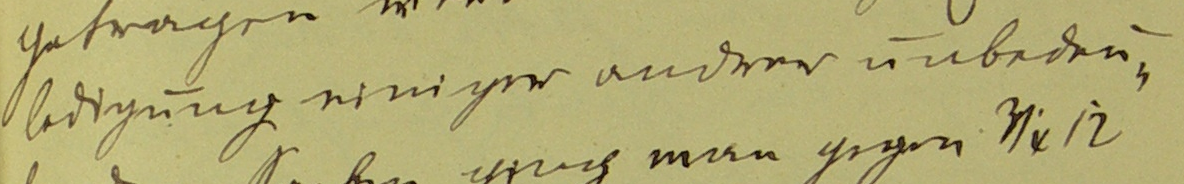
ledigung einiger anderer unbedeu¬
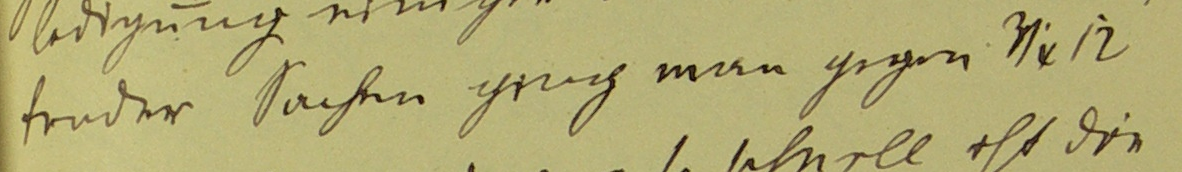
tender Sachen ging man gegen ¾ 12
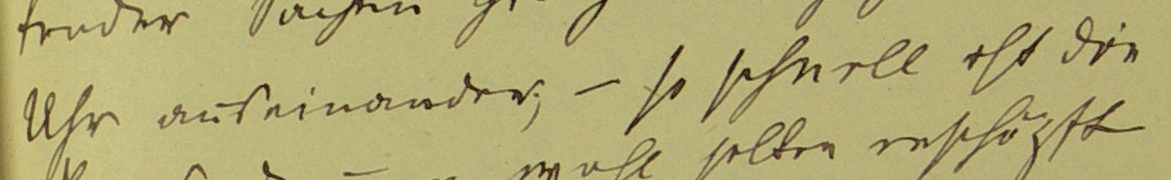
Uhr auseinander, -so schnell ist die
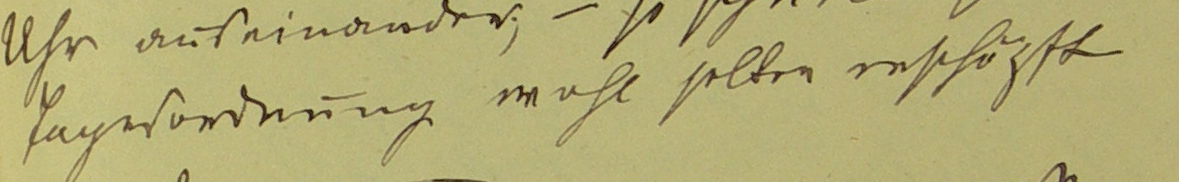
Tagesordnung wohl selten erschöpft
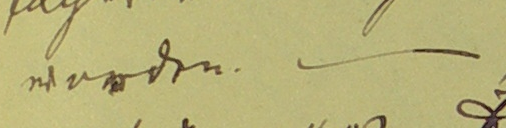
worden.
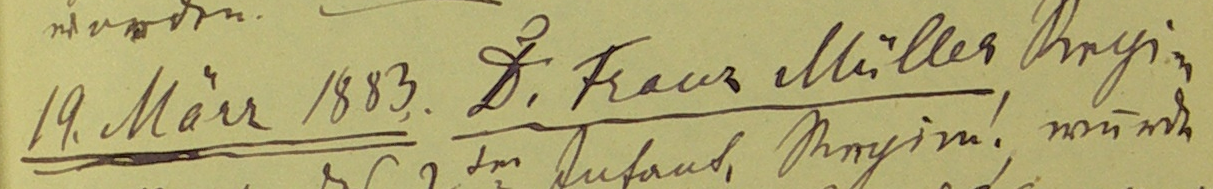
19. März 1883. Dr. Franz Müller. Regi¬
